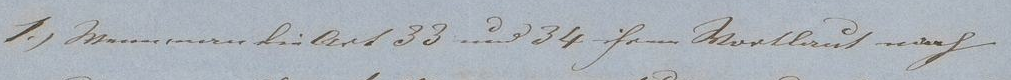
1.) Wenn man die Art 33 und 34 ihrem Wortlaut nach
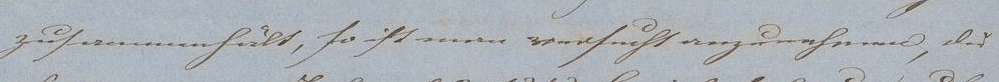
zusammenhält, so ist man versucht anzunehmen, die
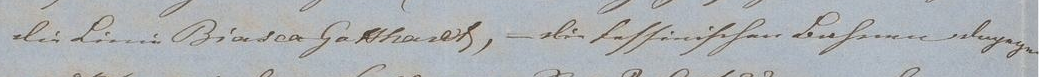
die Linie Biasca–Gotthard, – die tessinischen Bahnen dagegen
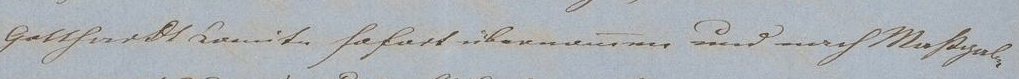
Gotthardtkomite sofort übernommen und nach Maßgabe
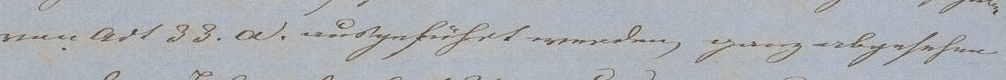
von Art 33. a. ausgeführt werden, ganz abgesehen
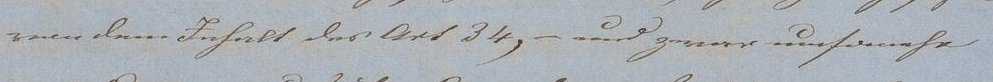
von dem Inhalt des Art 34, – und zwar umsomehr
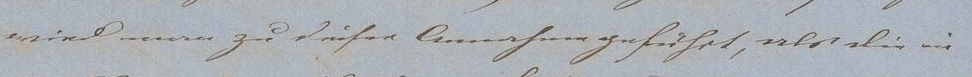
wird man zu dieser Annahme geführt, als die in
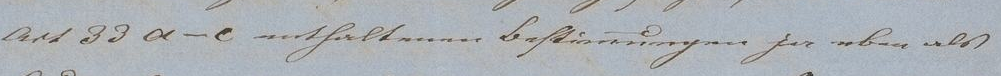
Art 33 a-e enthaltenen Bestimmungen ja eben als
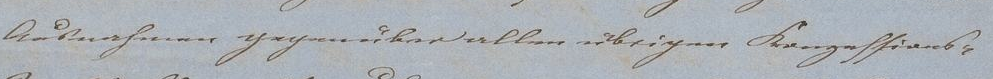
Ausnahmen gegenüber allen übrigen Konzessions-
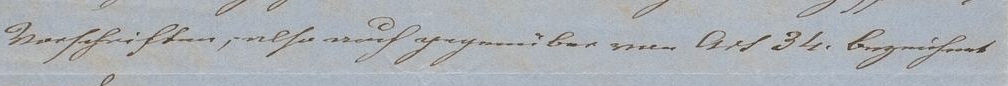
Vorschriften, also auch gegenüber von Art 34. bezeichnet
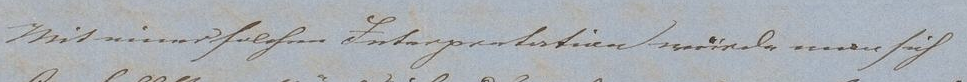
Mit einer solchen Interpretation würde man sich
